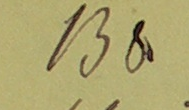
138
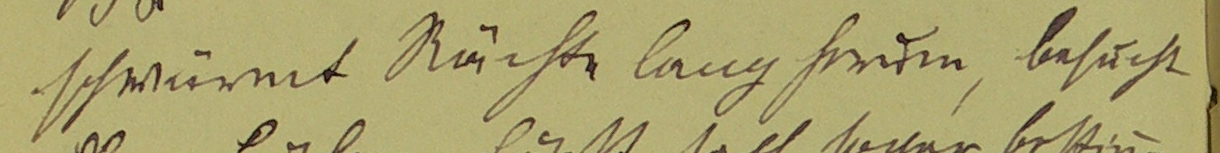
schwärmt Nächte lang herden, besucht
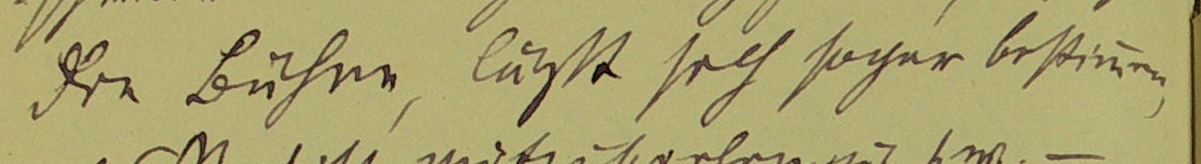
die Bühne, läßt sich sogar ?bestimmen
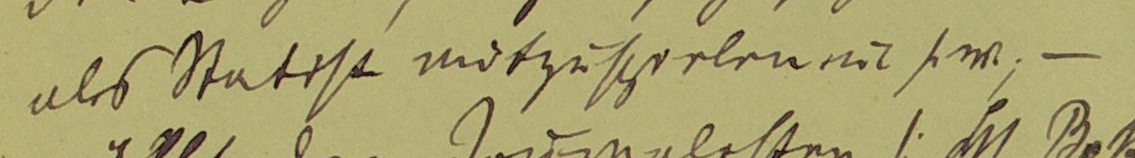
als Statist mitzuspielen u.s.w.
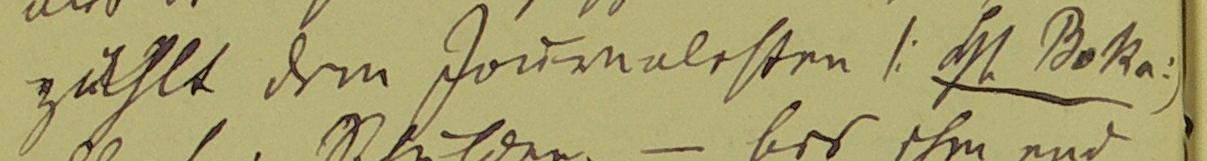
zahlt dem Journalisten ( :H. Boka: )
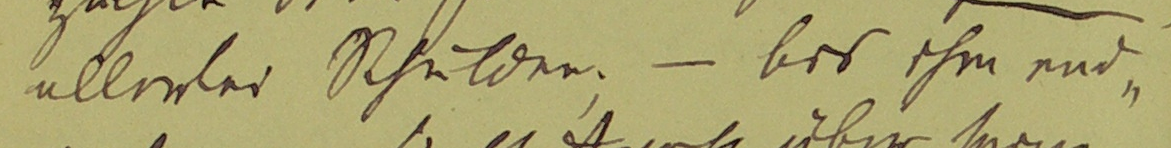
allerlei Schulden.- bis ihm end¬
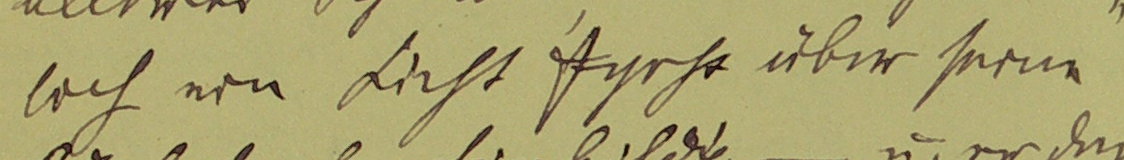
lich ein Licht aufgeht über seine
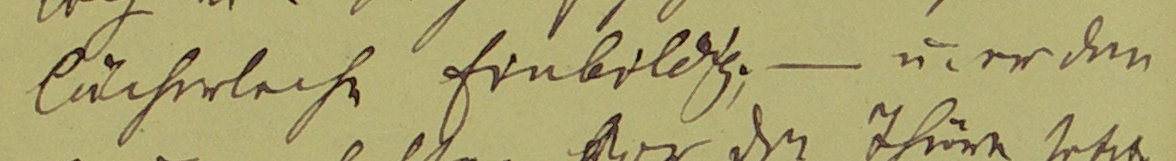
lächerlich Einbildung.- und er den
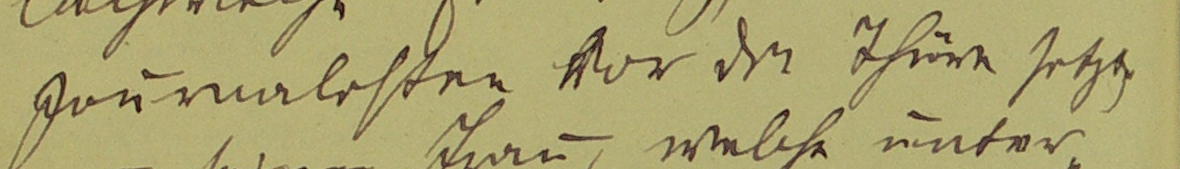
Journalisten vor die Thüre setzte,
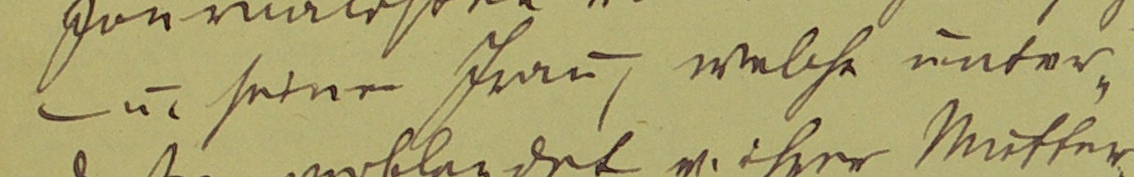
- und seine Frau, welche unter¬
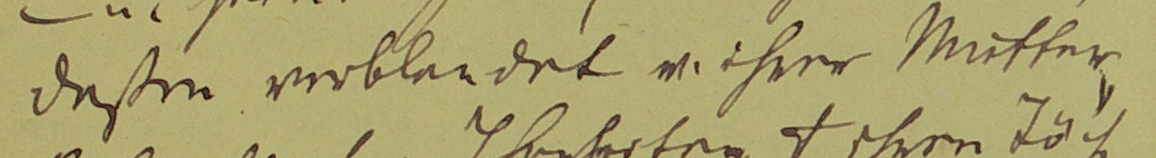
deßen verblendet von ihrer Mutter¬
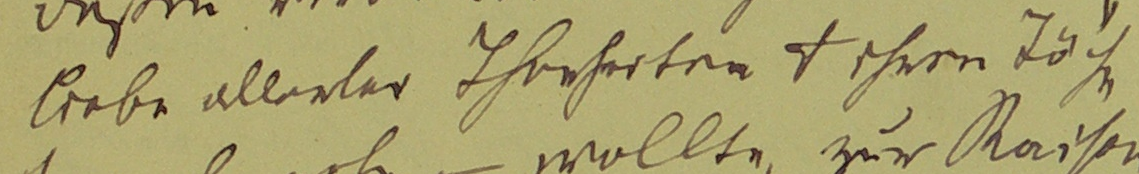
liebe allerlei Thorheiten mit Ihrer Töch¬
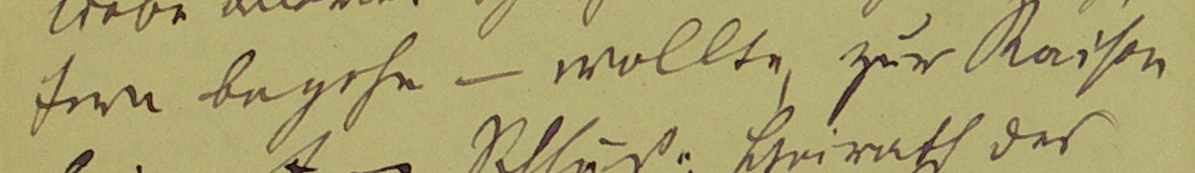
tern begehe –wollte,- zur Raison
